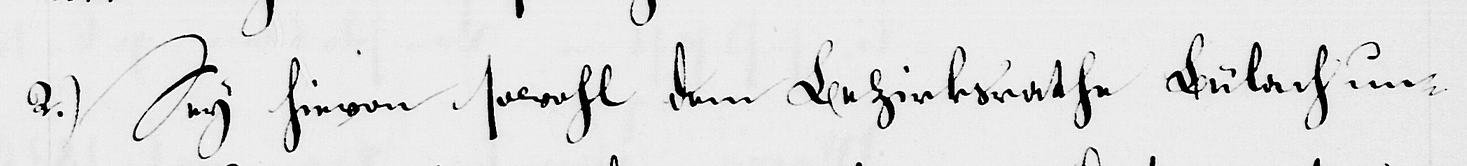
2.) Sey hievon sowohl dem Bezirksrathe Bülach un¬
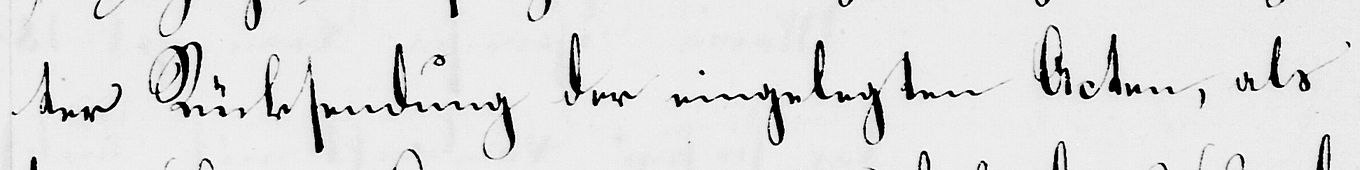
ter Rücksendung der eingelegten Acten, als
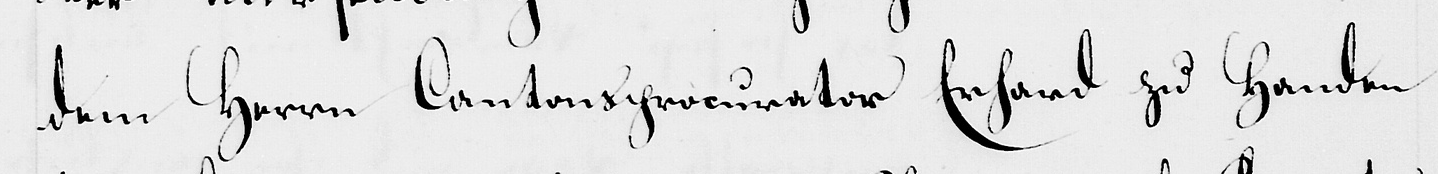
dem Herrn Cantonsprocurator Erhard zu Handen
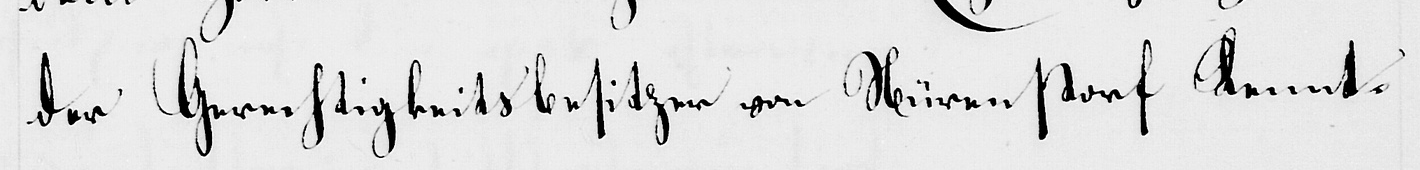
der Gerechtigkeitsbesitzer von Nürenstorf Kennt¬
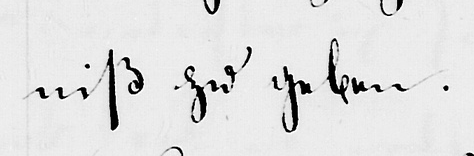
niß zu geben.
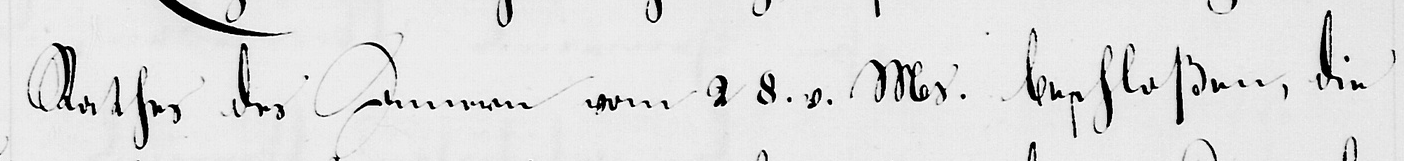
Rathes des Innern vom 28. v. Ms. beschloßen, die
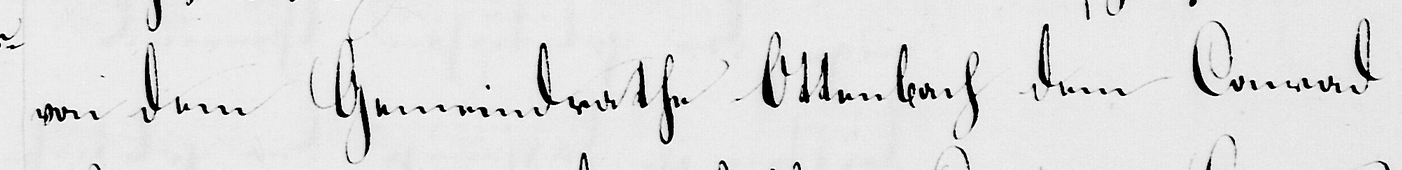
von dem Gemeindrathe Ottenbach dem Conrad
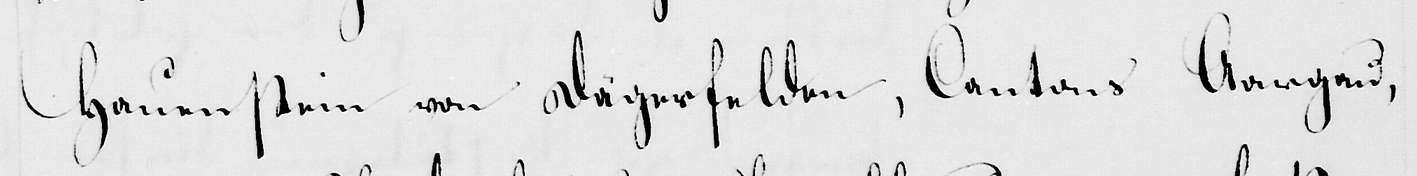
Hauenstein von Dägerfelden, Cantons Aargau,
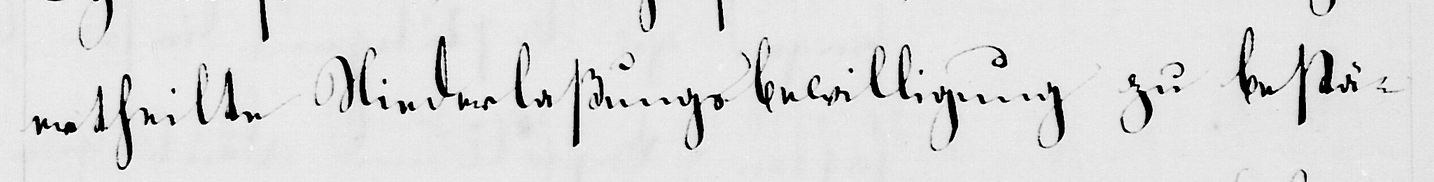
ertheilte Niederlaßungsbewilligung zu bestä¬
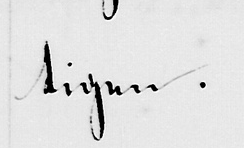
tigen.
